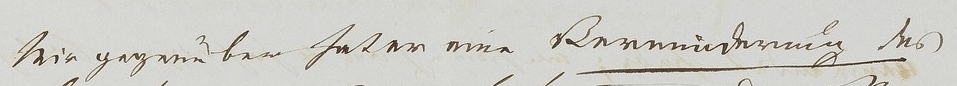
Mir gegenüber hat er eine Verminderung des
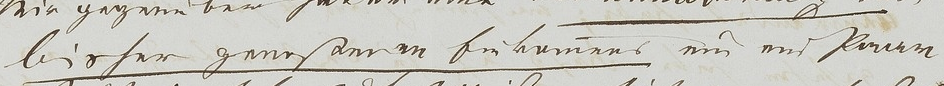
bisher genossenen Einkommens um ein Paar
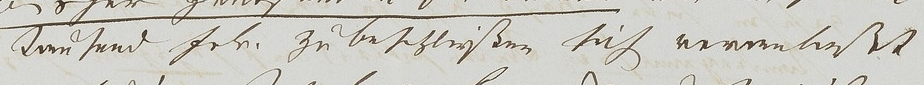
Tausend frk. zu beschließen sich veranlaßt
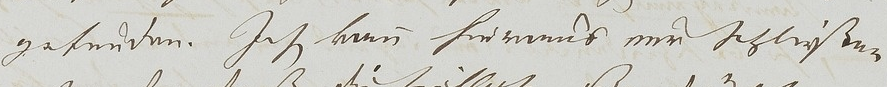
gefunden. Ich kann hieraus nur schließen
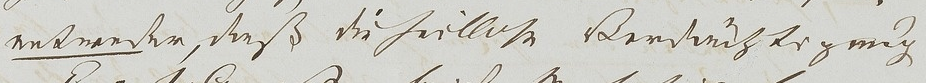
entweder, daß die heillose Verdächtigung
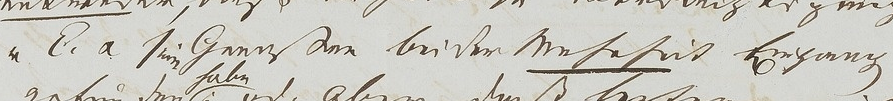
v E. & seinen Genossen bei der Mehrheit Eingang
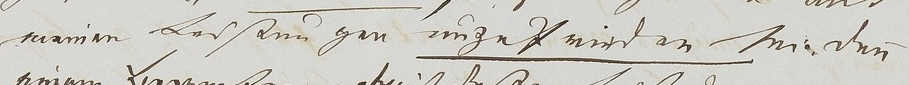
meinen Leistungen gar unzufrieden sei: denn
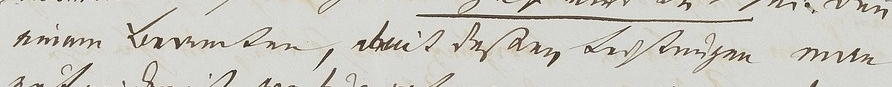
einem Beamten, mit dessen Leistungen man
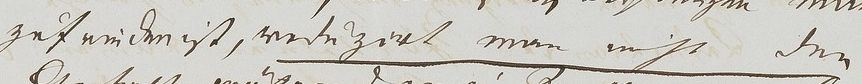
zufrieden ist, reduzirt man nicht den
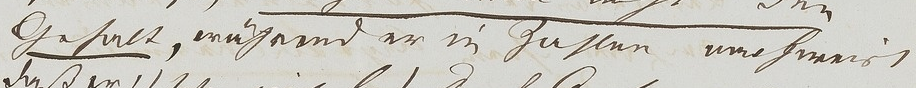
Gehalt, während er in Zahlen nachweist
